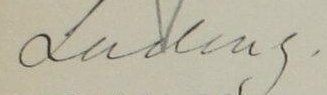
Ladeng
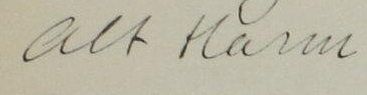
Alt Harm
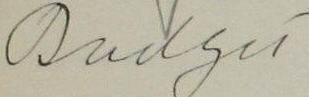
Budget
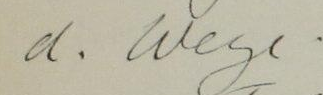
d. Wege
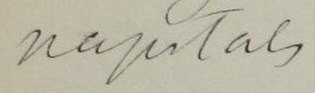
kapitals
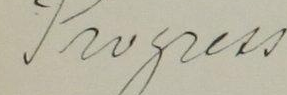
Progress
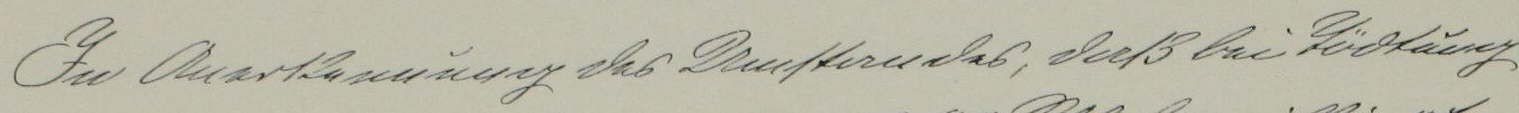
In Anerkennung des Umstandes, daß bei Tödtung
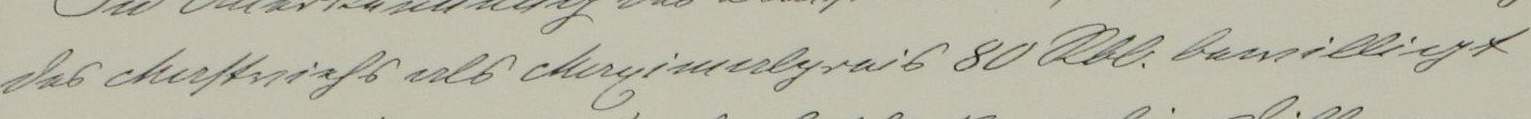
des Mastviehs als Maximalpreis 80 Rbl. bewilligt
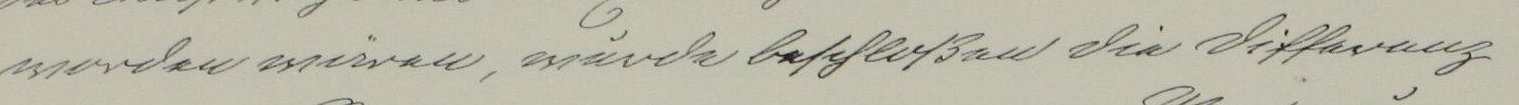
worden wären, wurde beschloßen die Differenz
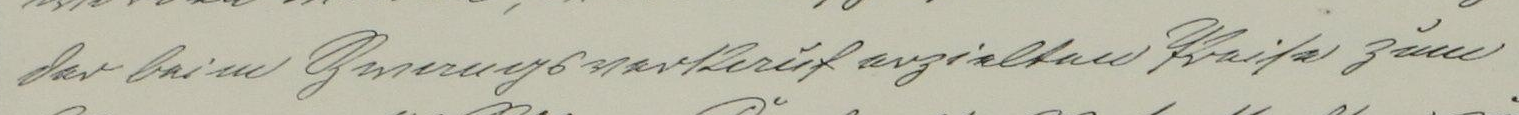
der beim Zwangsverkauf erzielten Preise zum
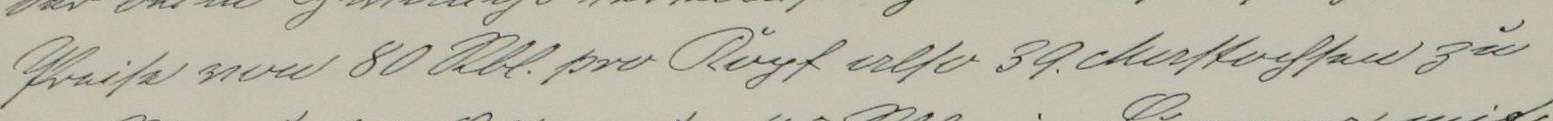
Preise von 80 Rbl. pro Kopf also 39. Mastochsen zu
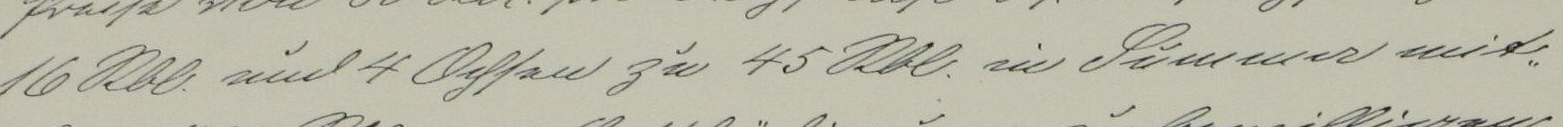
16 Rbl. und 4 Ochsen zu 45 Rbl. in Summa mit-
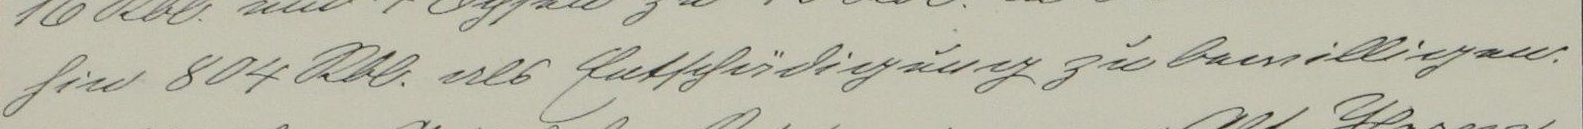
hin 804 Rbl. als Entschädigung zu bewilligen.
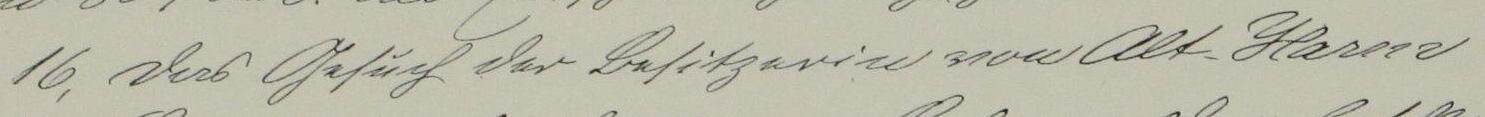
16. Das Gesuch der Besitzerin von Alt-Harm
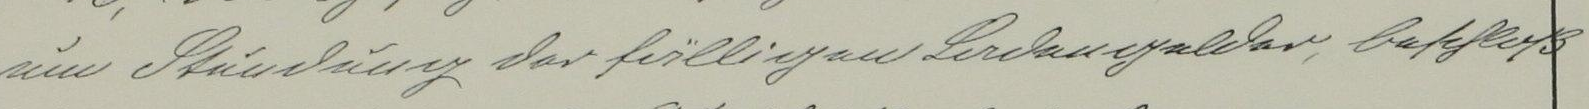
um Stundung der fälligen Ladengelder, beschloß
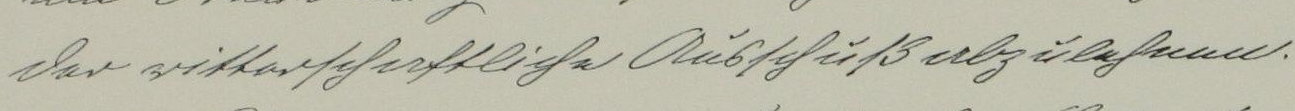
der ritterschaftliche Ausschuß abzulehnen.
